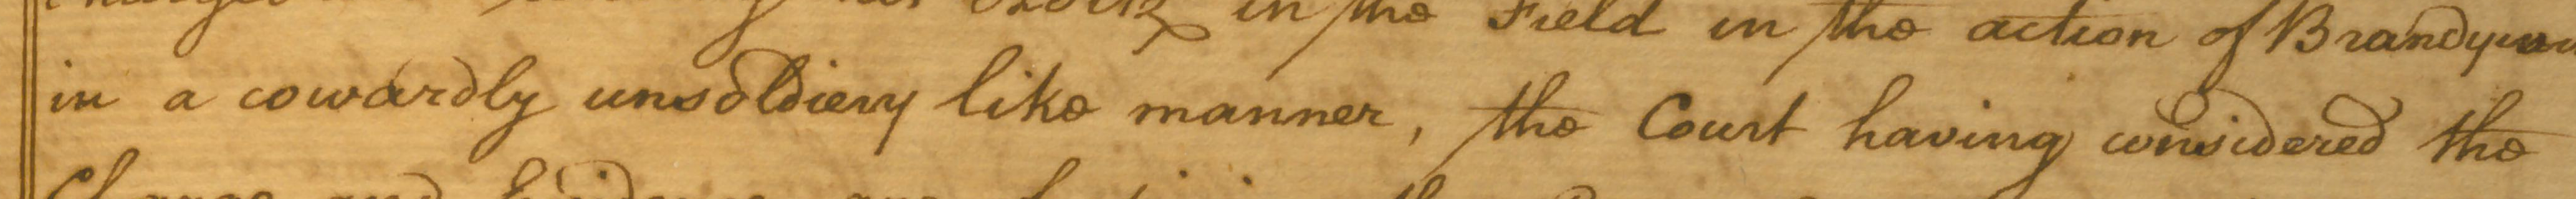in a cowardly unsoldiery like manner, the Court having considered the
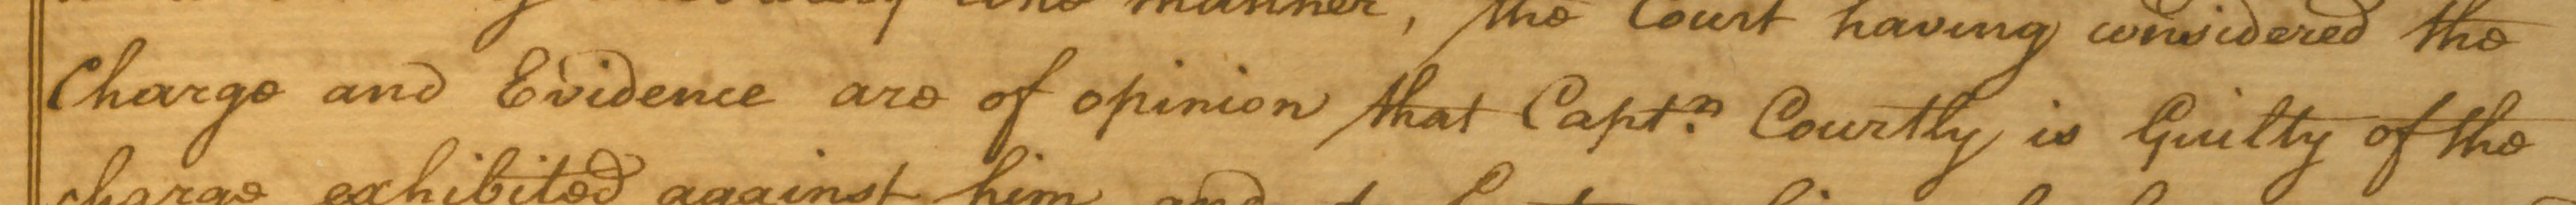Charge and Evidence are of opinion that Capt^n. Courtly is Guilty of the
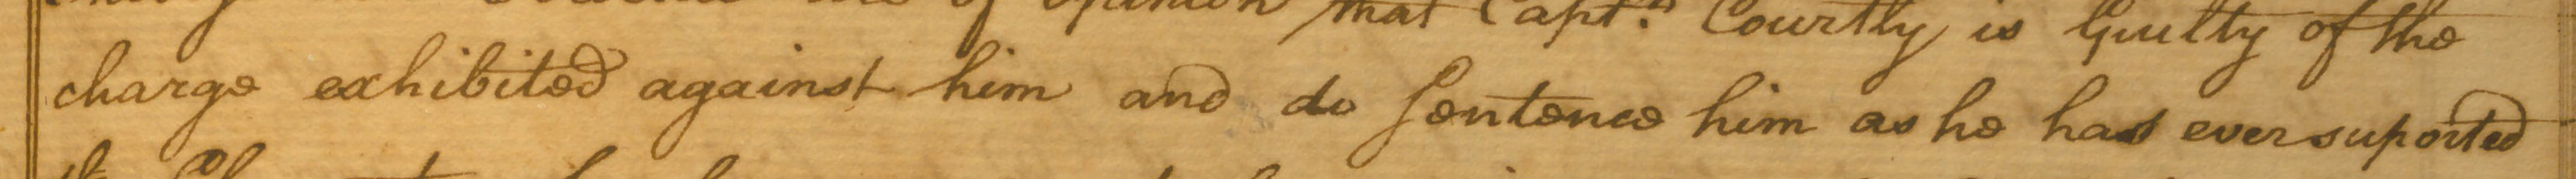charge exhibited against him and do sentence him as he had ever suported
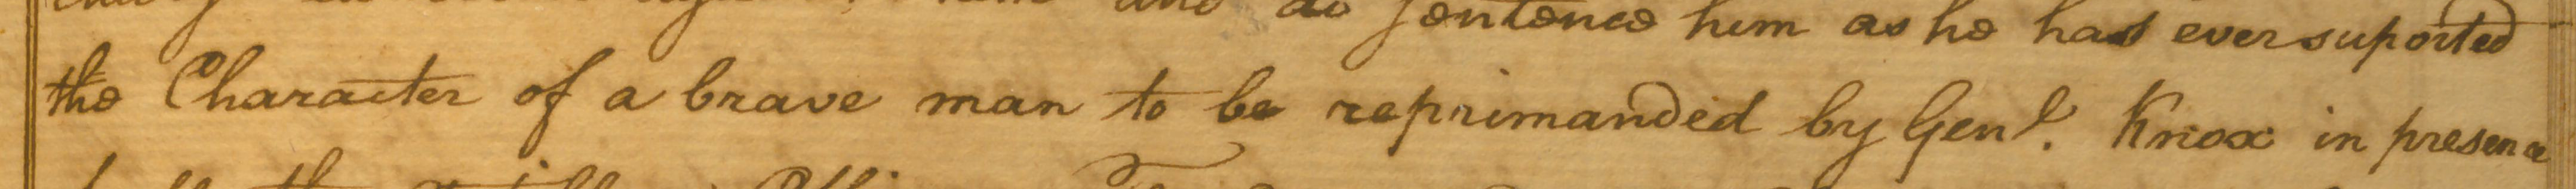the Character of a brave man to be reprimanded by Gen^l. Knox in presence
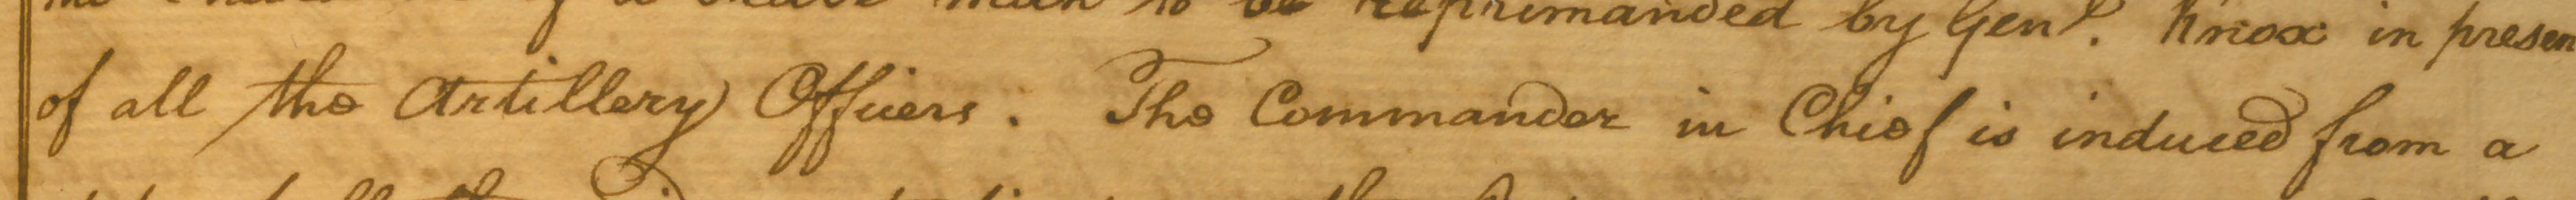of all the Artillery Officers. The Commander in Chief is induced from a
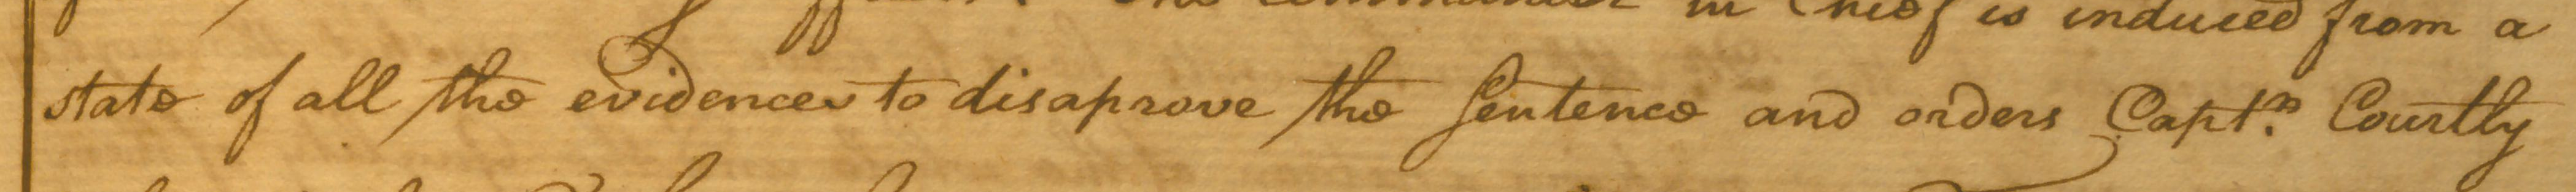state of all the evidence to disaprove the sentence and orders Capt^n. Courtly
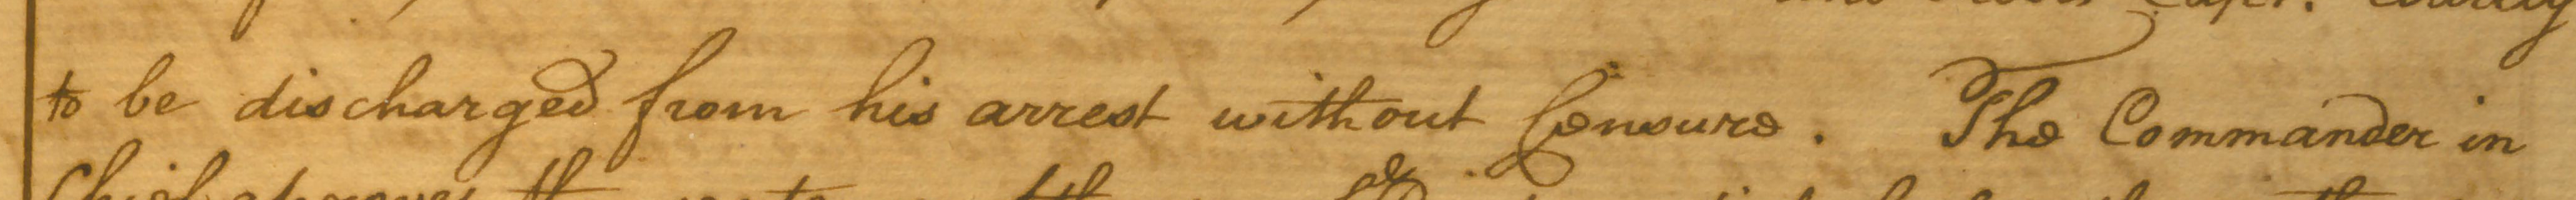to be discharged from his arrest without Censure. The Commander in
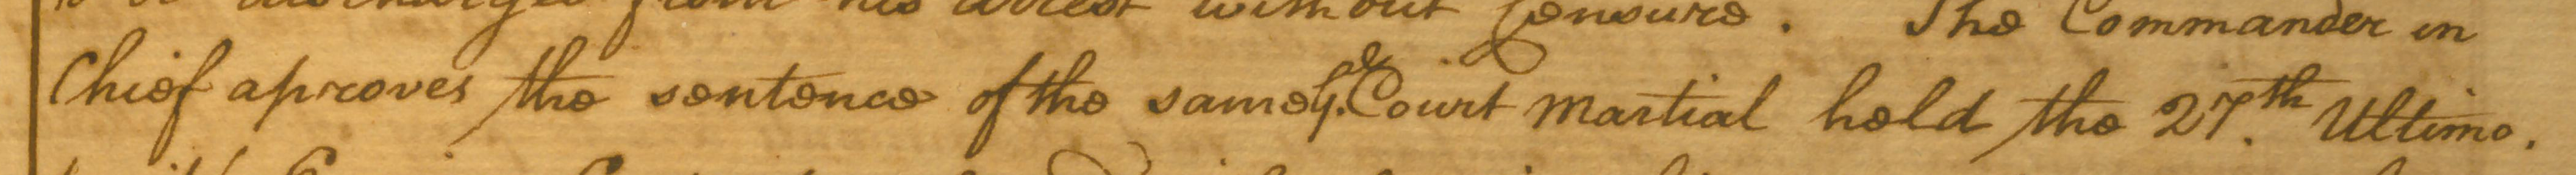Chief aproves the sentence of the same G^l. Court martial held the 27^th. Ultimo.
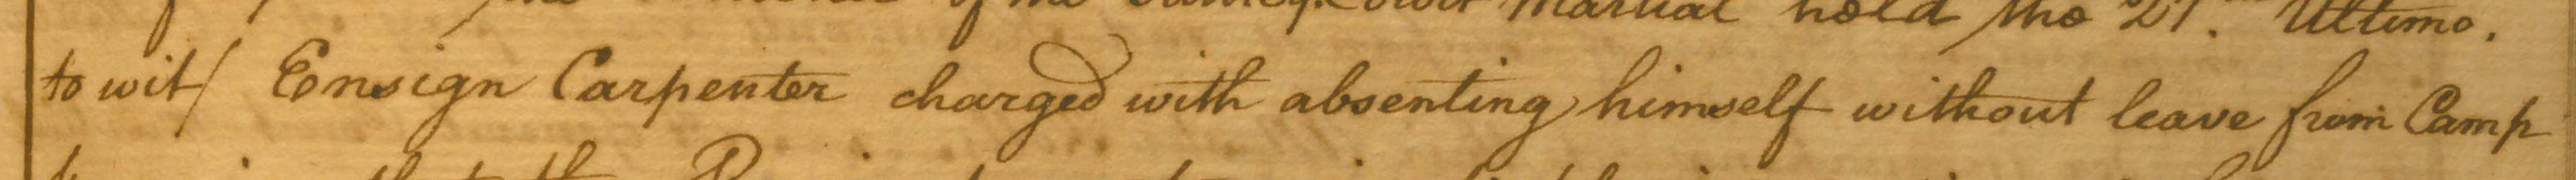to wit/ Ensign Carpenter charged with absenting himself wihtout leave from Camp
